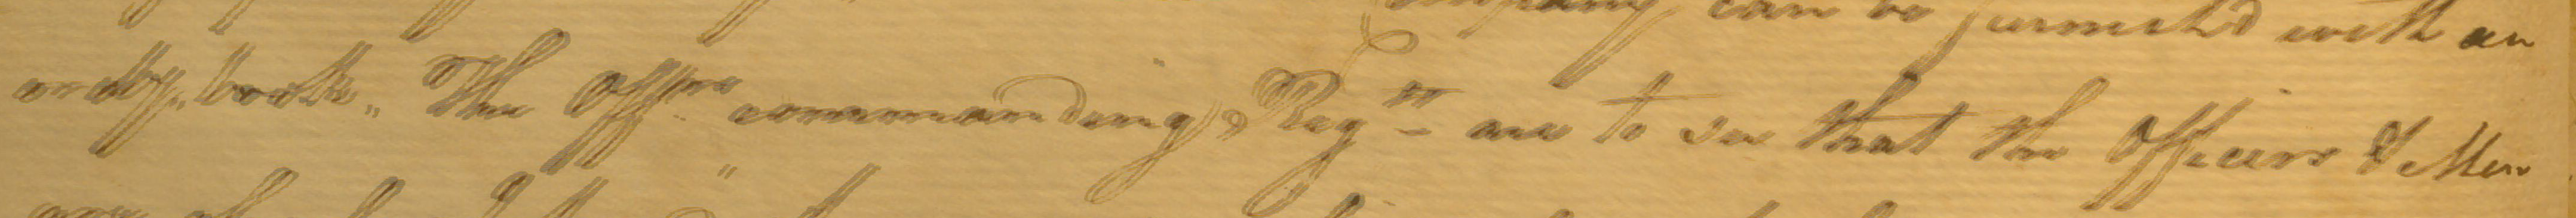orderly book. The Off^rs. commanding Reg^ts are to see that the Officers & Men
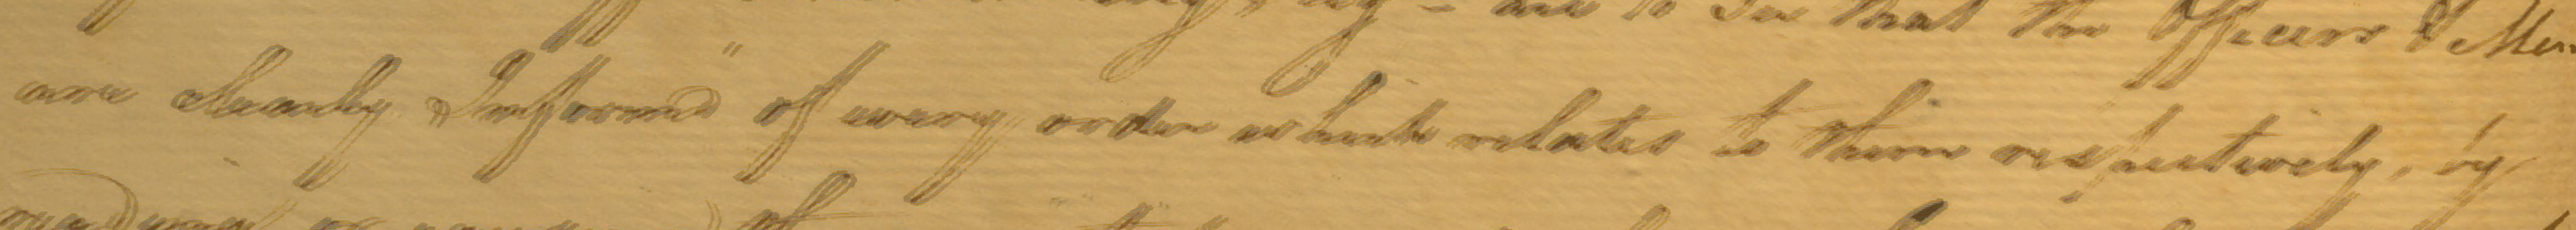are clearly Informed of every order which relates to them respectively, by
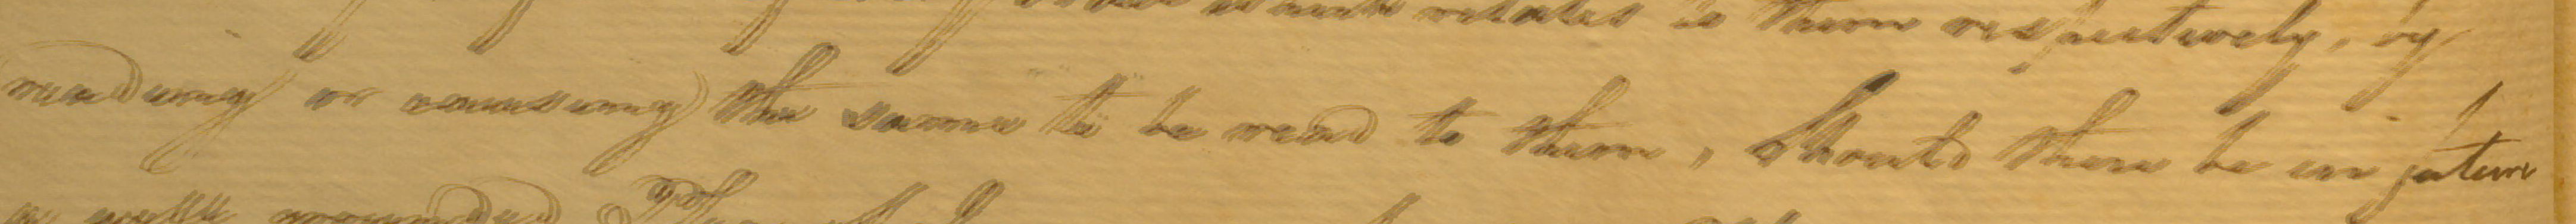reading or causing the same to be read to them. Should there be in future
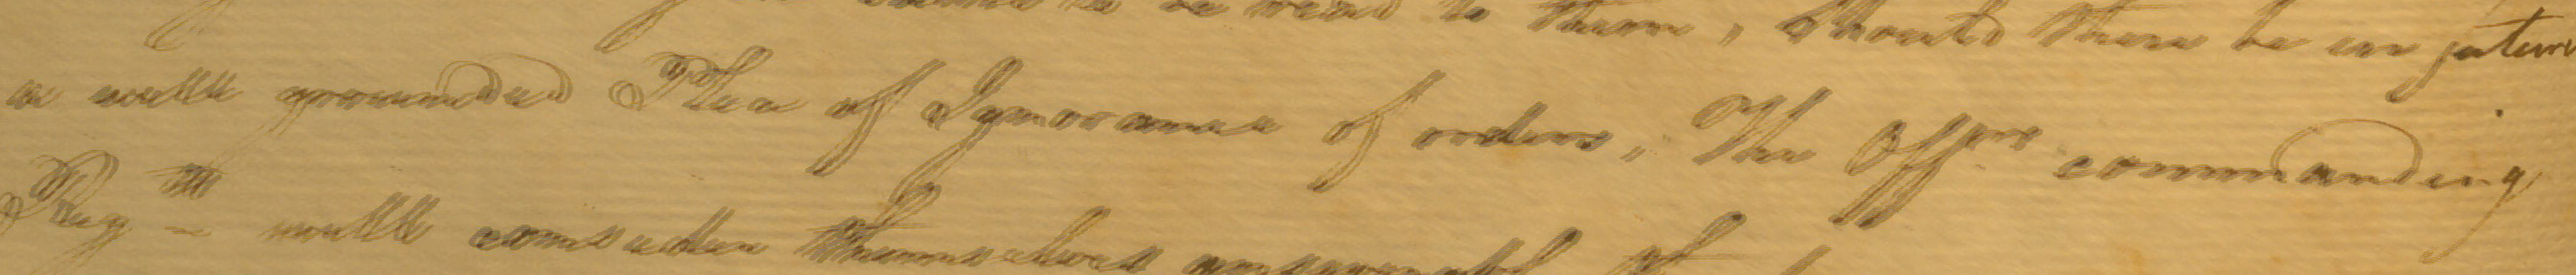a well grounded Plea of Ignorance of orders, The Off^rs commanding
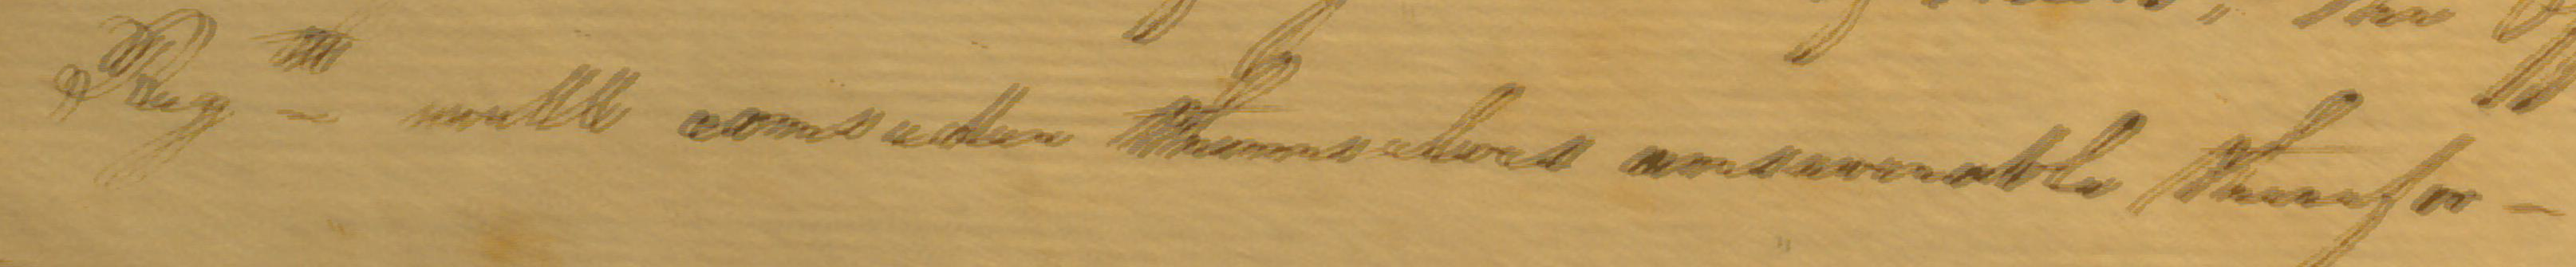Reg^ts will consider themselves answerable therefor-
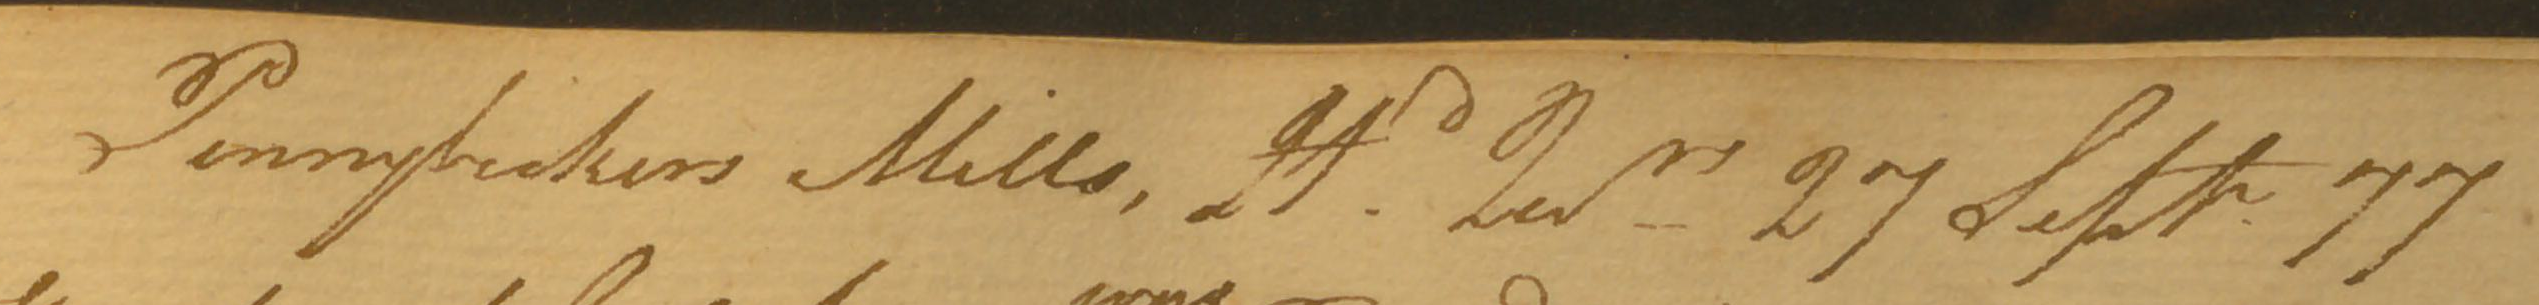Pennypackers Mills, H^d. Qu^rs. 27 Sept^r. 77
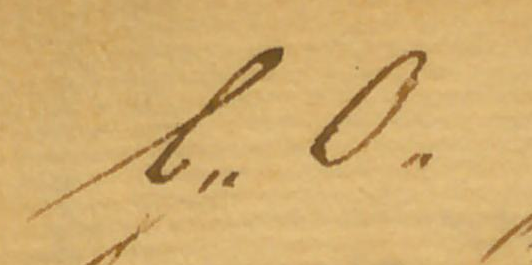G.O.
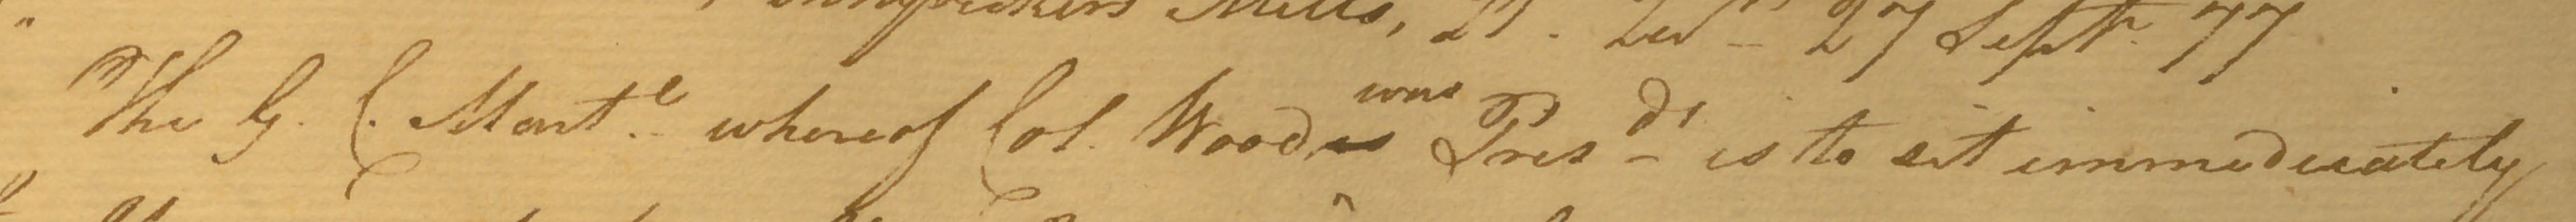The G. C. Mart^l. whereof Col. Wood [is] ^was Pres^dt is to sit immediately
